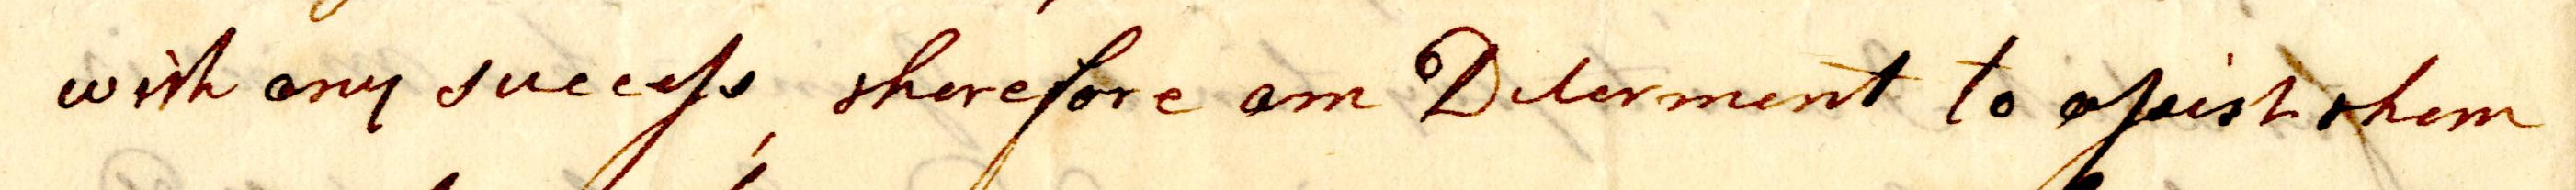with any success therefore am Determent to assist them
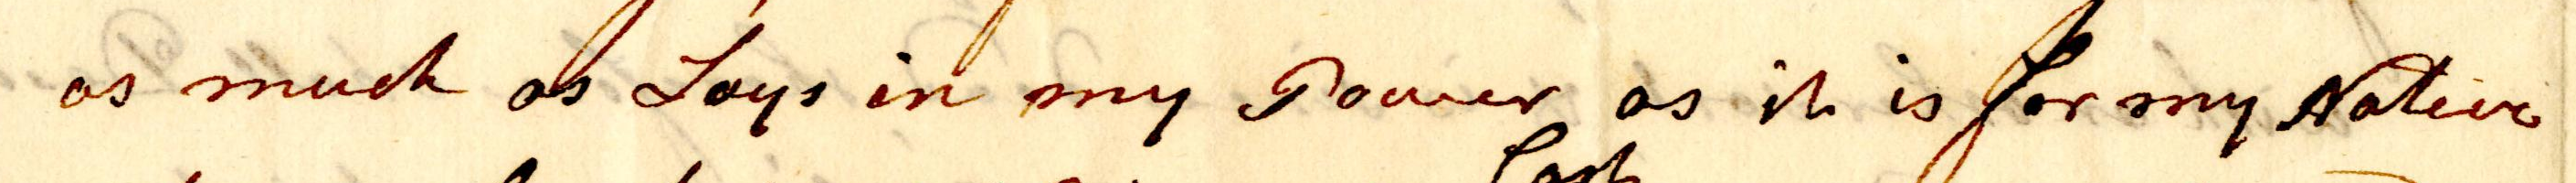as much as Lays in my Power as it is for my Native
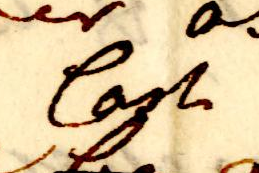Cost
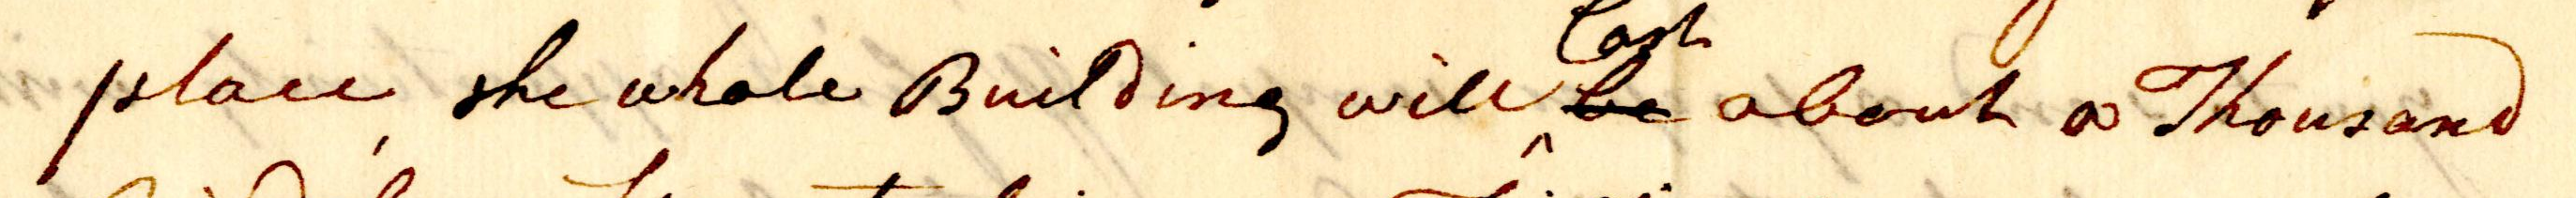place the whole Building will ^ [be] about a Thousand
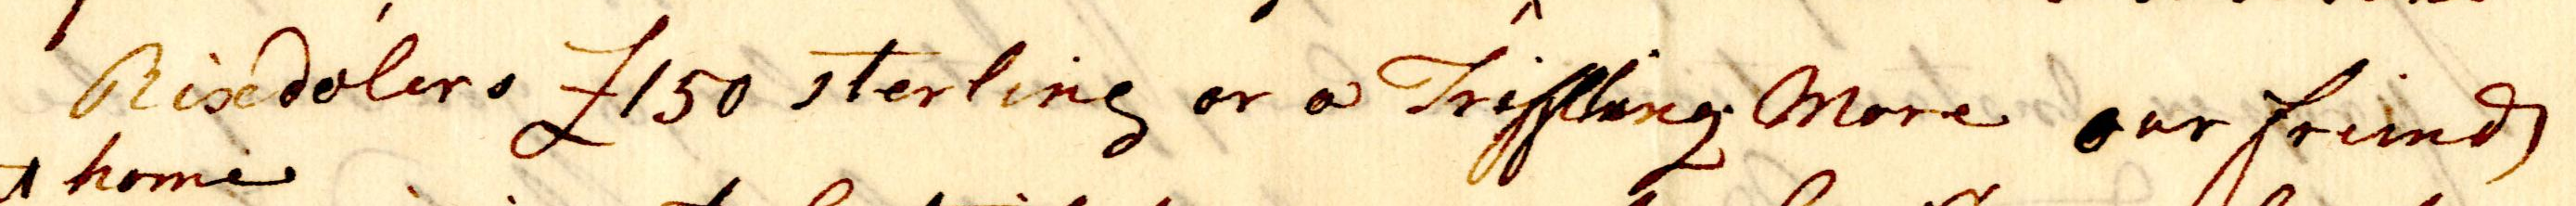Rixdolers £150 sterling or a Triffling more our friend
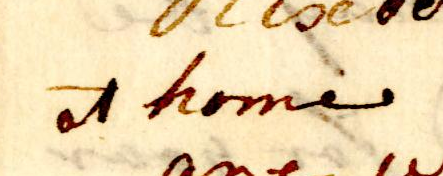at home
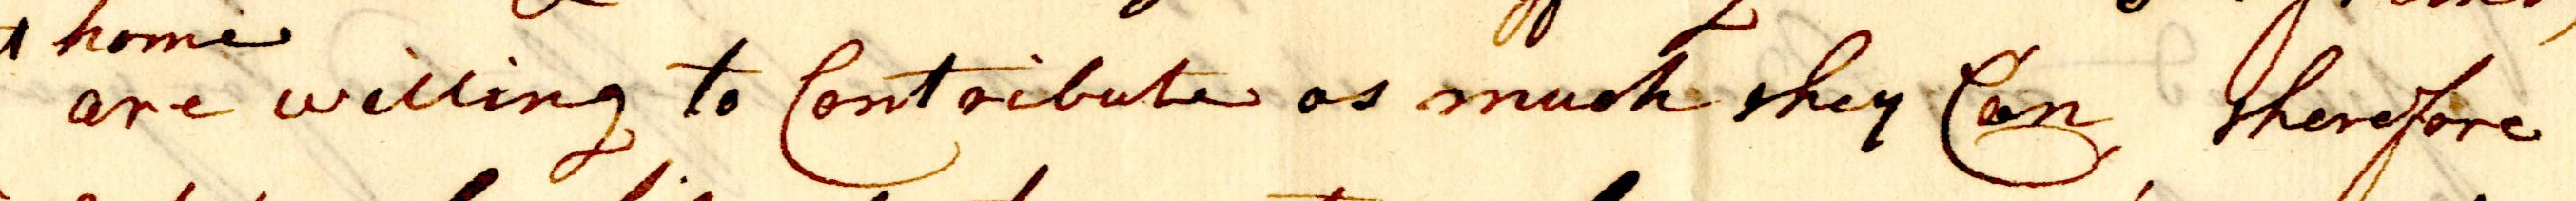are willing to Contribute as much they Can, Therefore
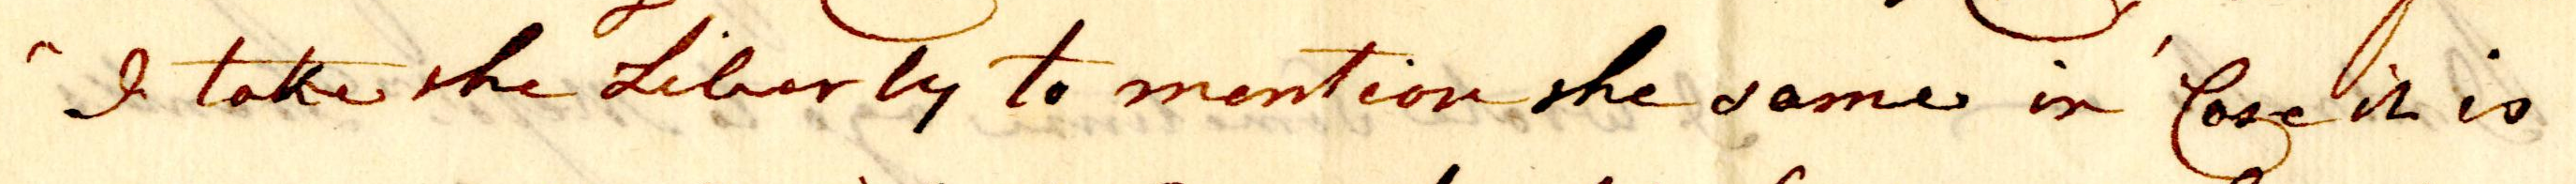I take the liberty to mention the same in Case it is
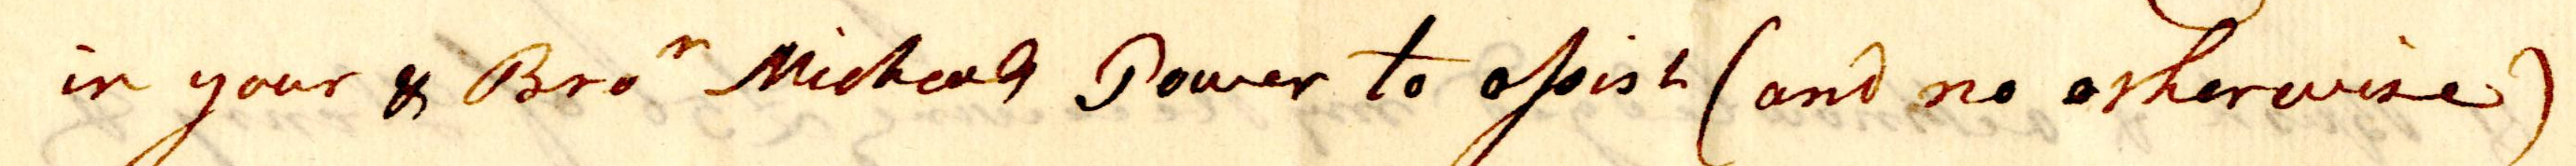in your & Bro^r Michaels power to assist (and no otherwise)
